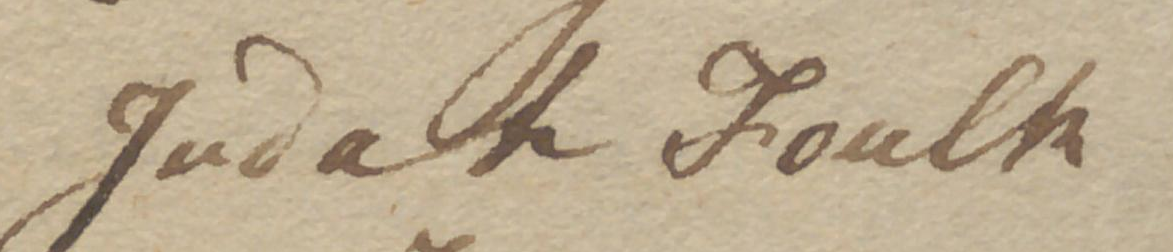Judah Foulk
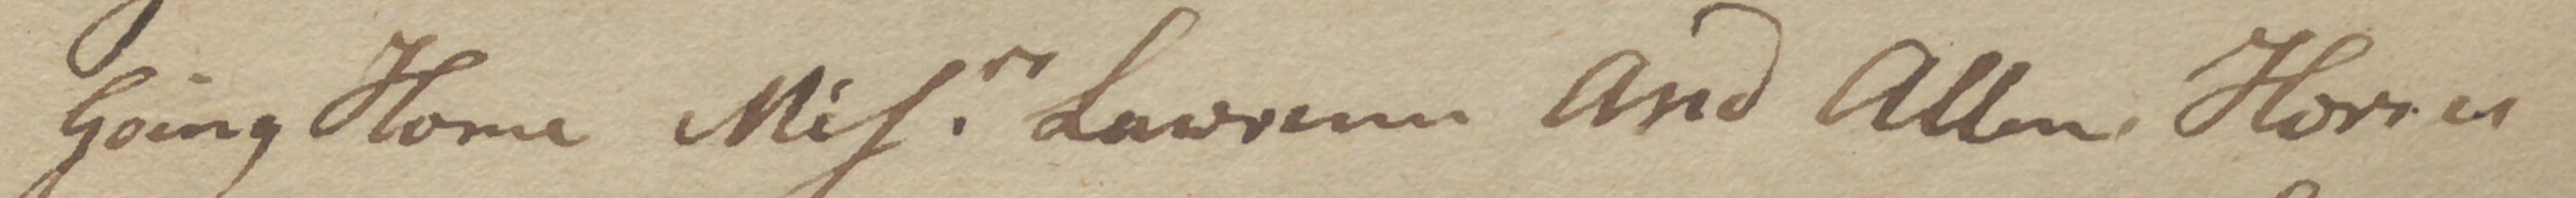Going Home Mis^r. Lawrence And Allen Horses
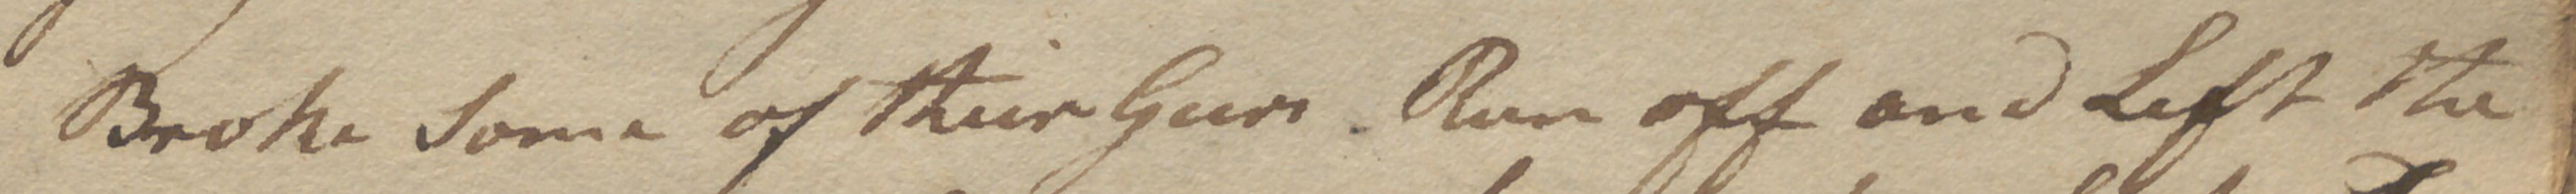Broke some of their Geers. Run off and Left the
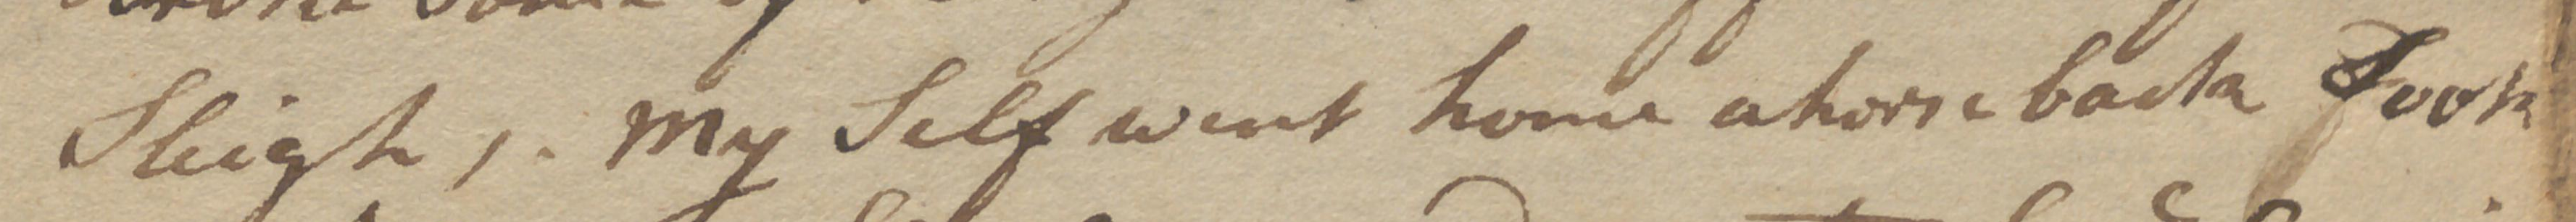Sleigh, My Self went home a horseback Took
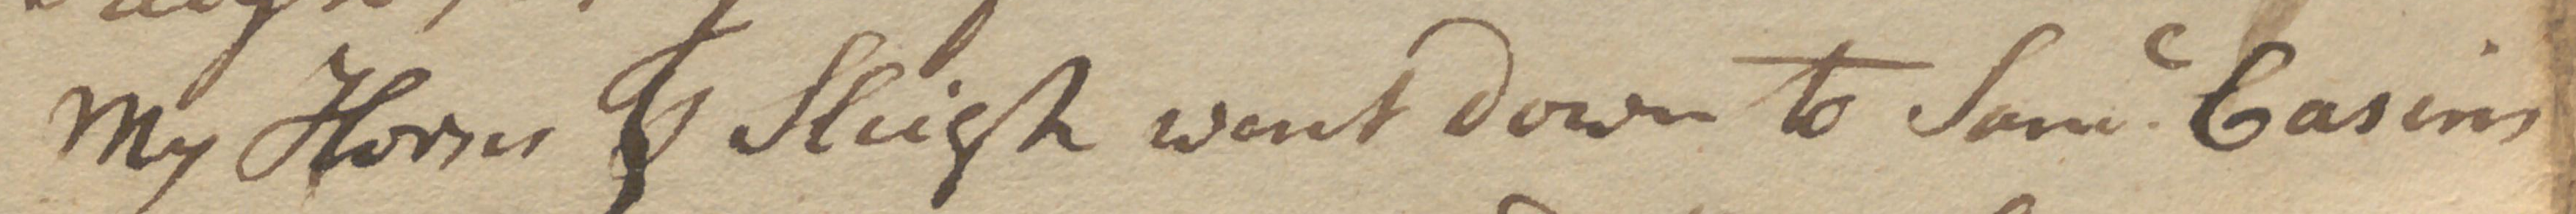My Horses & Sleigh went down to Sam^l. Casins
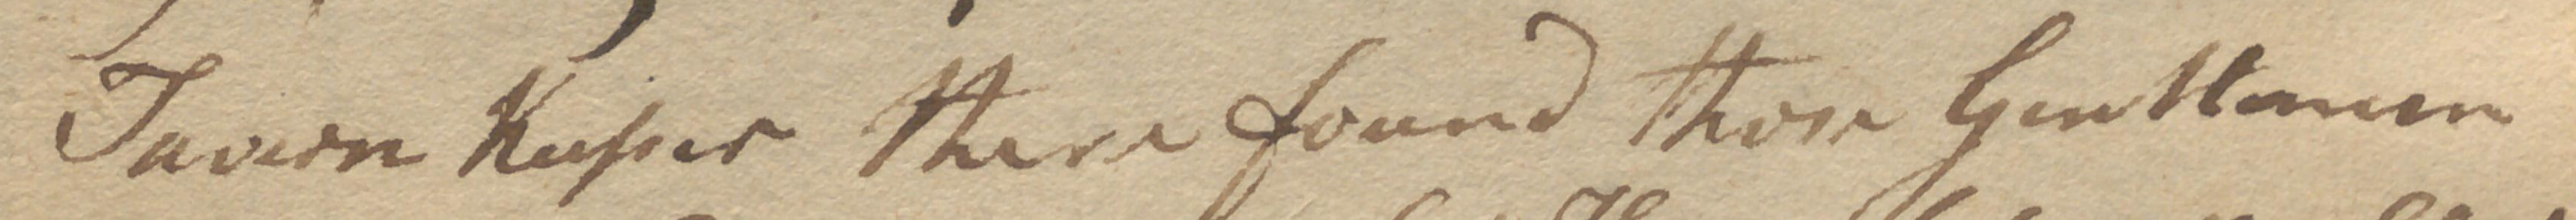Tavern Keeper there found those Gentlemen
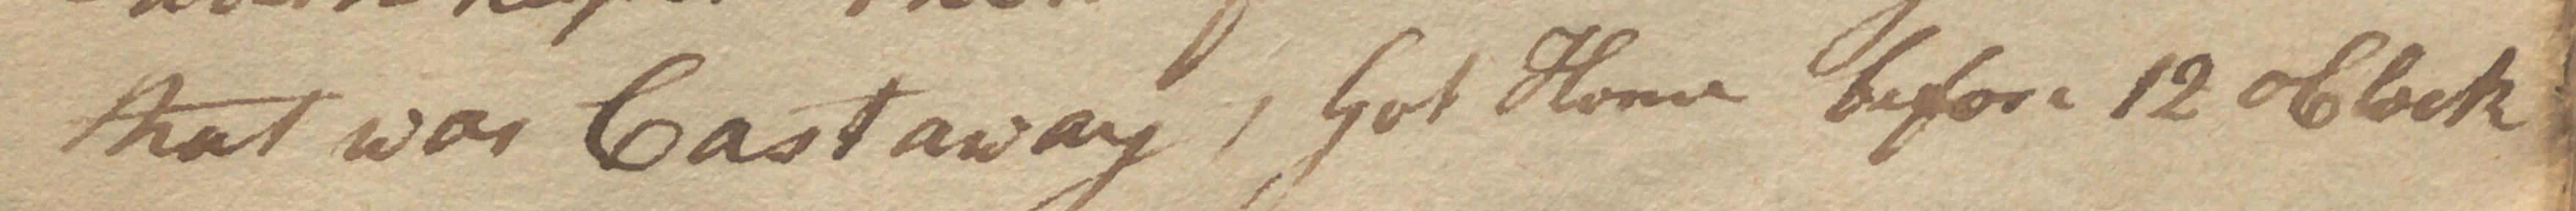that was Castaway, Got Home before 12 oClock
